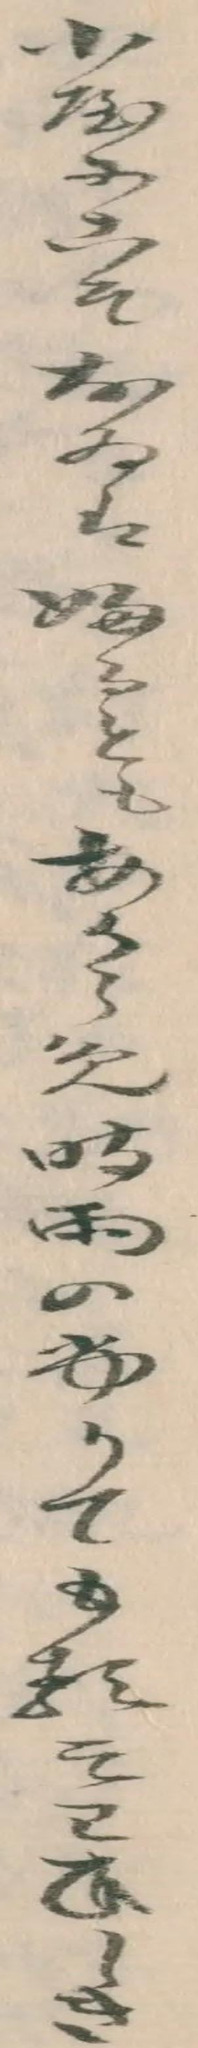小屋にこそなゐはふるともあからめ時雨のふりてもるそわひしき
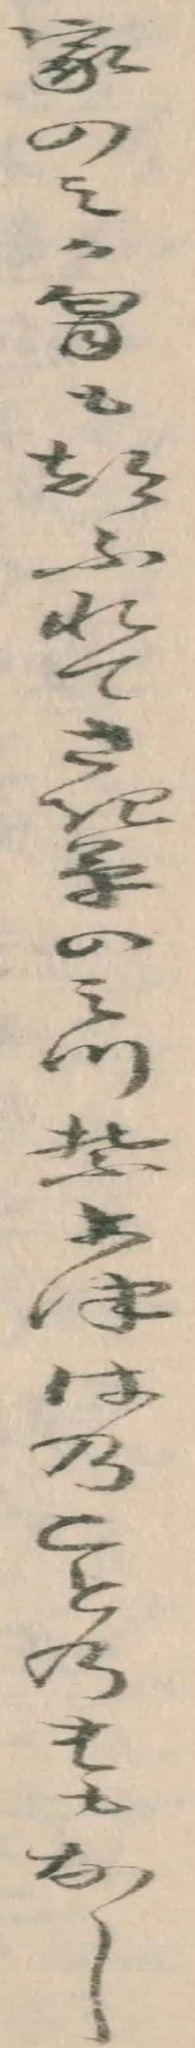家のみか胸もつふれてさき草のみつ葉よつはのことのはもなし
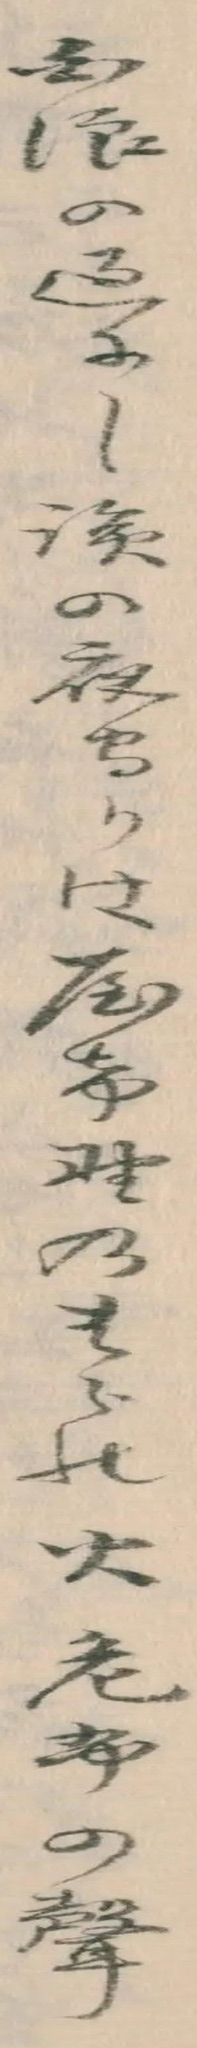白浪の過にし浜の夜守りはやけ野のはらの火危ふの声
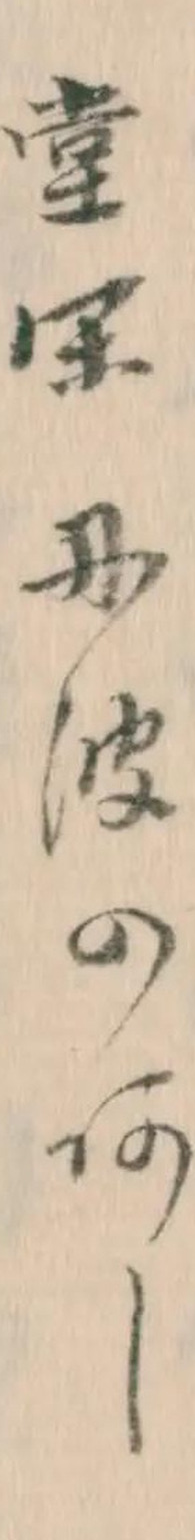堂閑丹波のあし
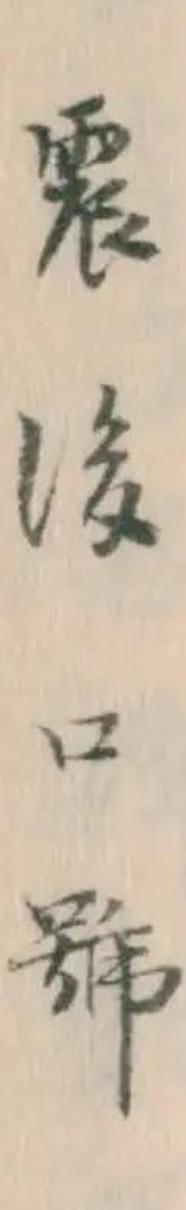震後口号
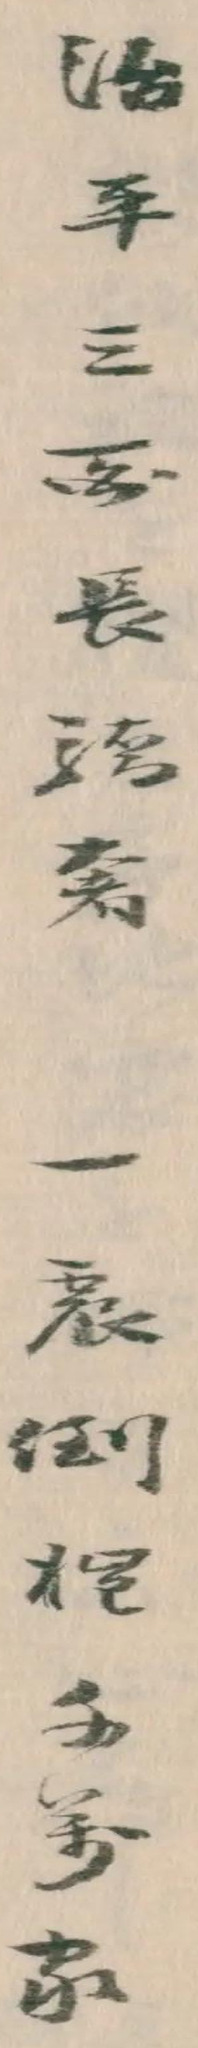治平三百長驕奢一震倒摧千万家
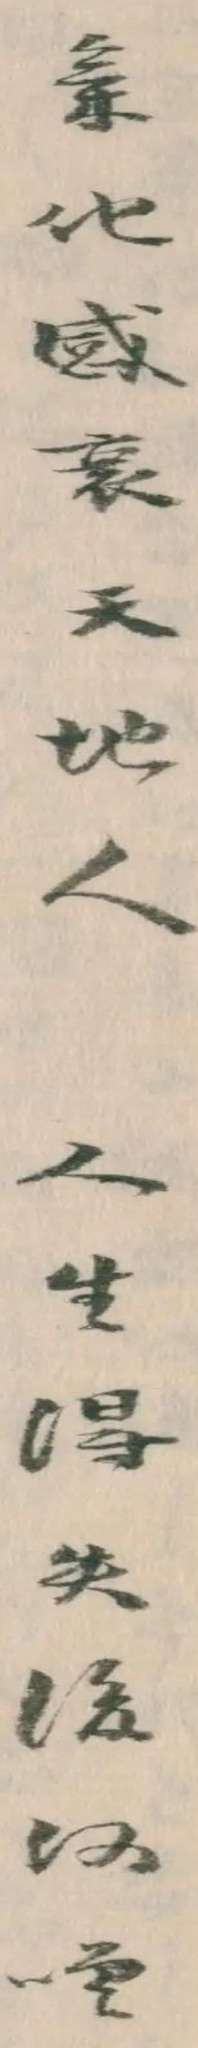気化感衰天地人人生得失後何噌
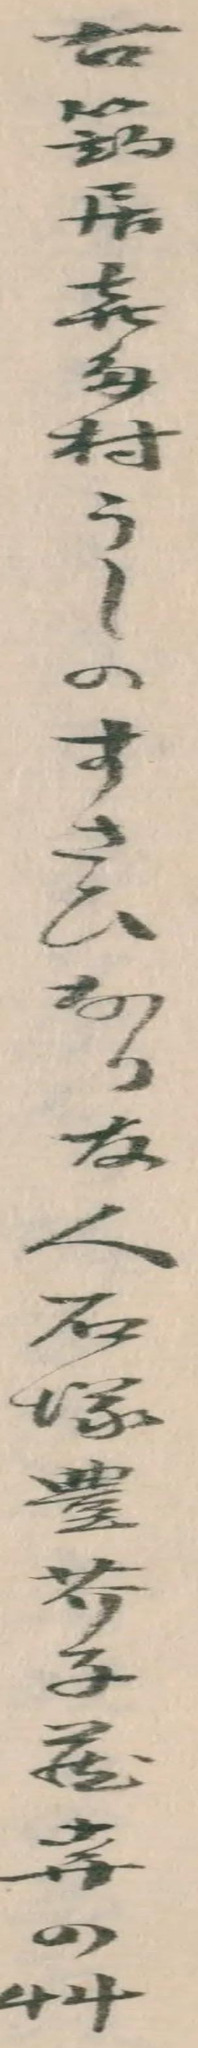右筠居喜多村うしのすさひなり友人石塚豊芥子蔵莽の草
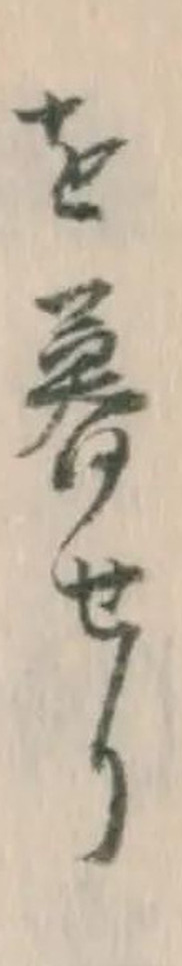を暮せり
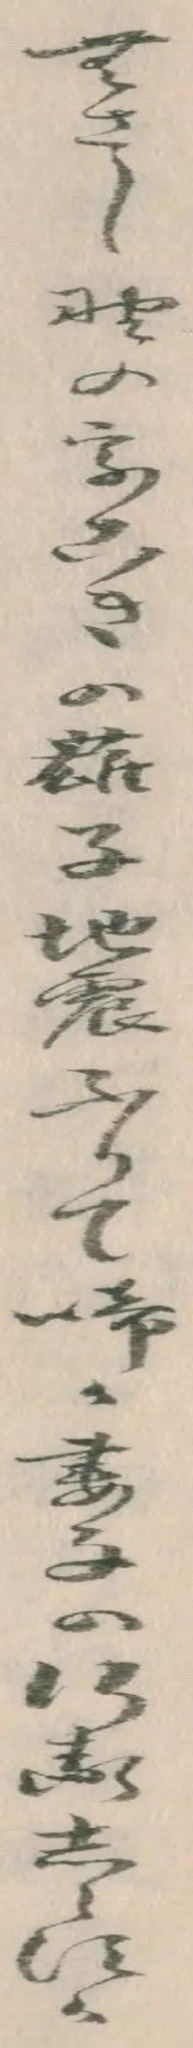むさし野のうこきの雉子地震ふりて啼か妻子の行ゑしらすか
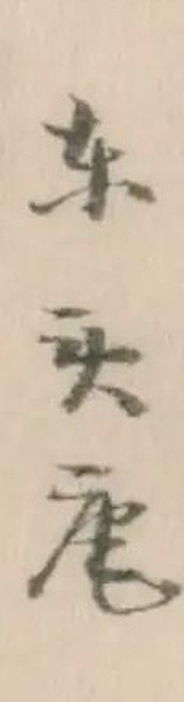東夷庵
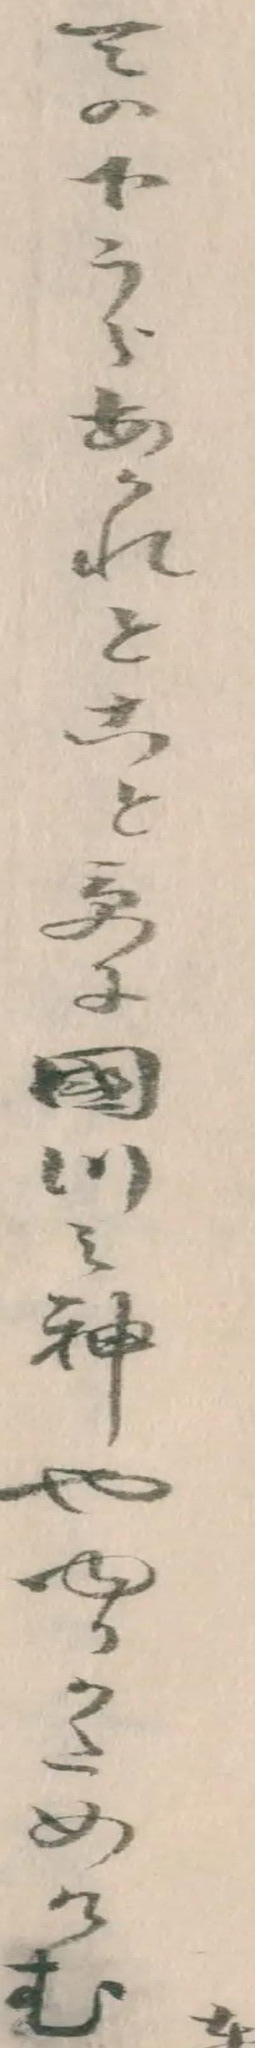天の下うらあかれとこと更に国つみ神やゆりかためけむ

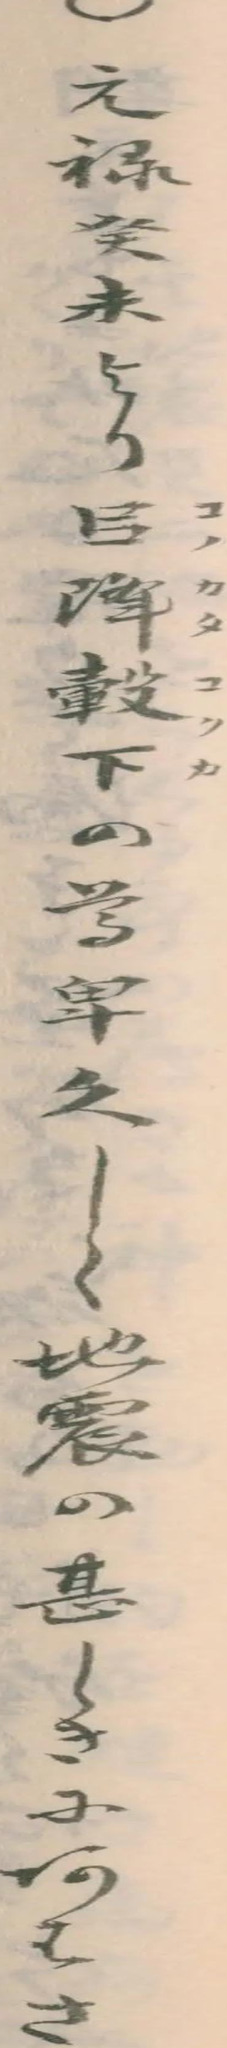○元禄癸未より㠯降轂下の尊卑久しく地震の甚しきにあはさ
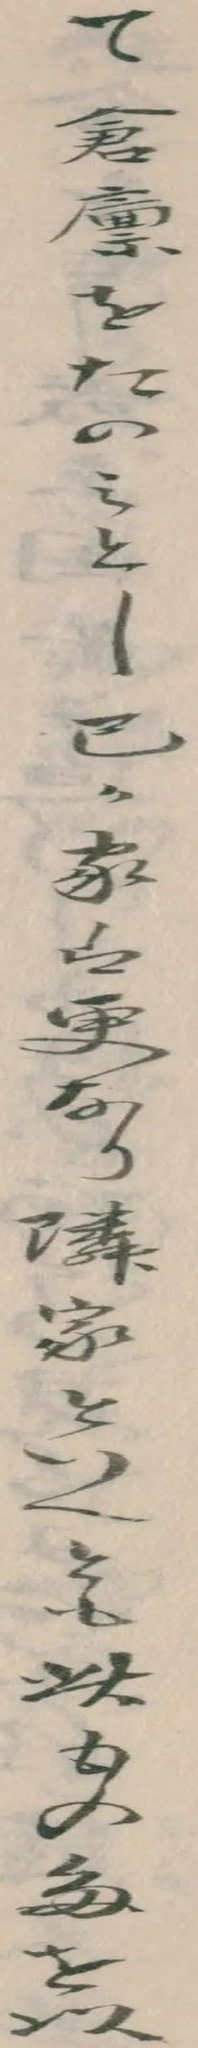て倉廩をたのみとし己か家は更なり隣家といへとも此もの多を以
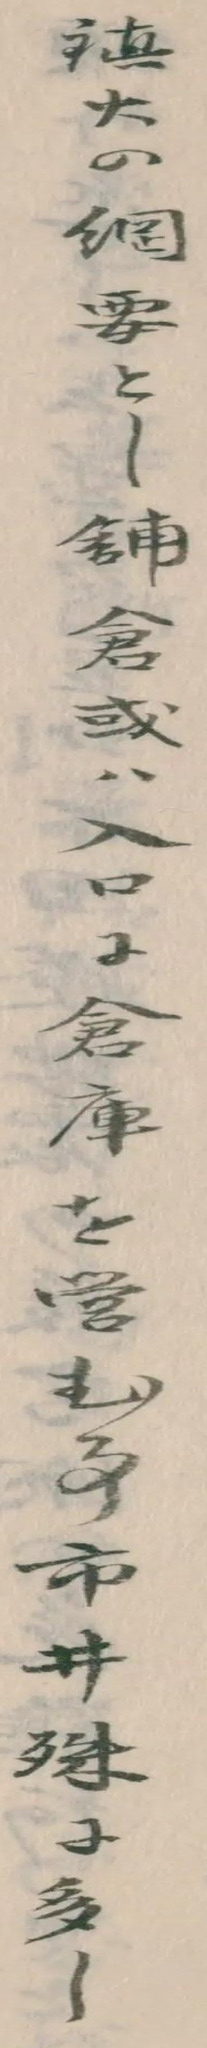鎮火の綱要とし舗倉或は入口に倉庫を営む事市井殊に多し
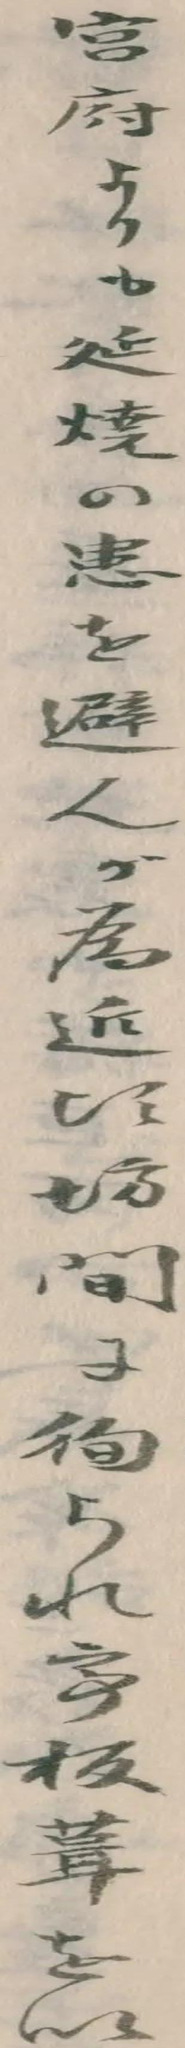宮府よりも延焼の患を避んが為近頃坊間に徇られて板葺を以
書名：地災撮要. 巻10(地震之部) 上,下
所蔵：国立国会図書館 National Diet Library, JAPAN
